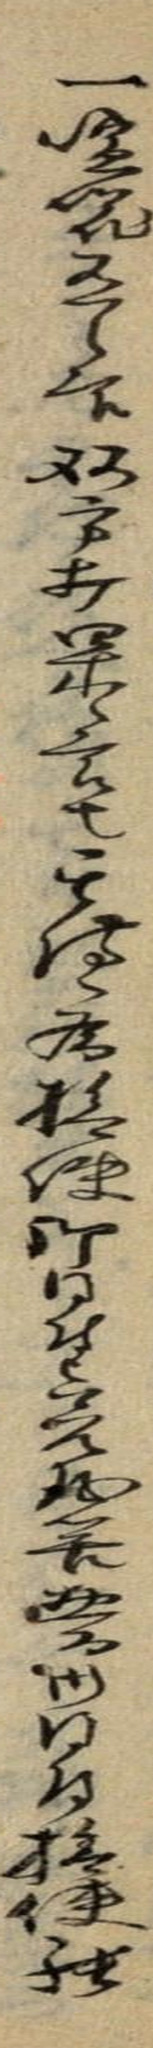一喧嘩有之節双方打果候節は其場へ為検使御目付被差越筈惣而御目付検使罷
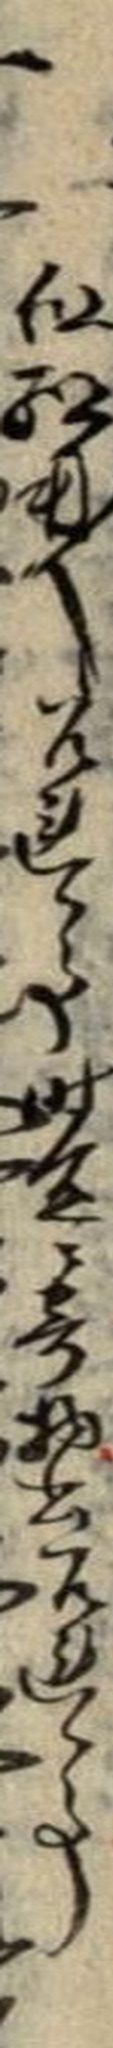但組用人召連候事時宜ニ寄物書召連候事
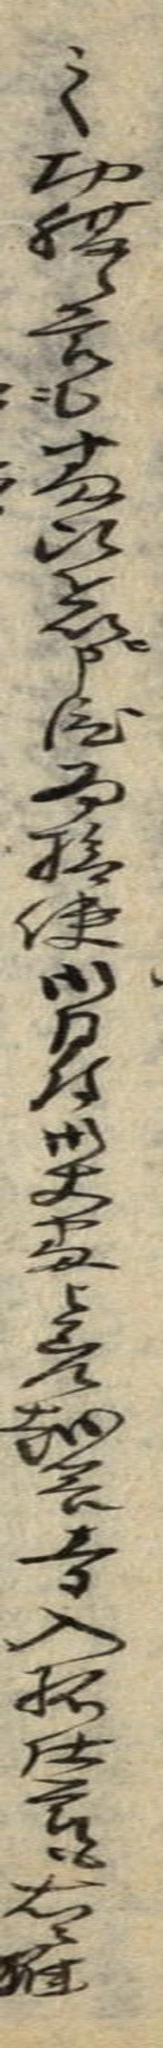之切腹之節も番頭を以申渡為検使御目付御使番被差越筈寺入抔仕節も右ニ准ス
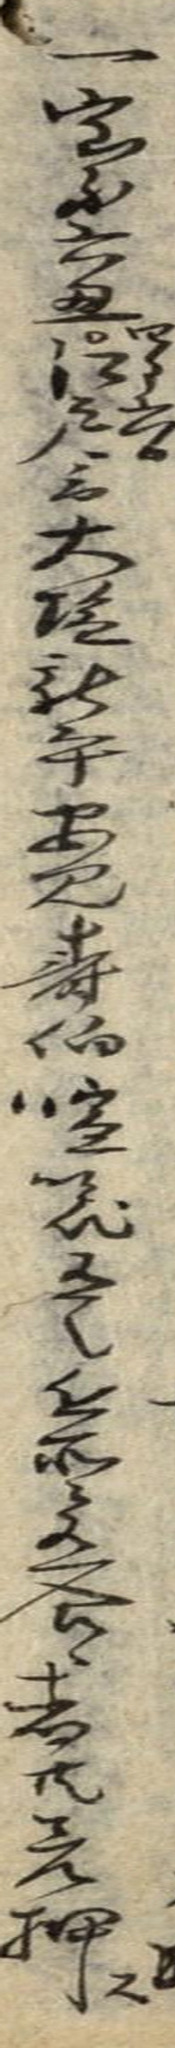一宝永六丑四月六日江戸ニ而大塩新平安見寿伯喧嘩有之近所ニ有合候者共差押
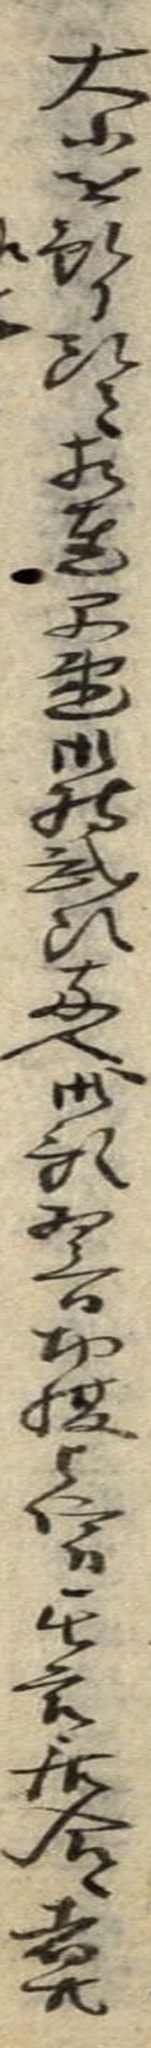大小を預り頭々へ相達早速御持武頭両人へ御預翌日切腹被仰付其節居合候者共
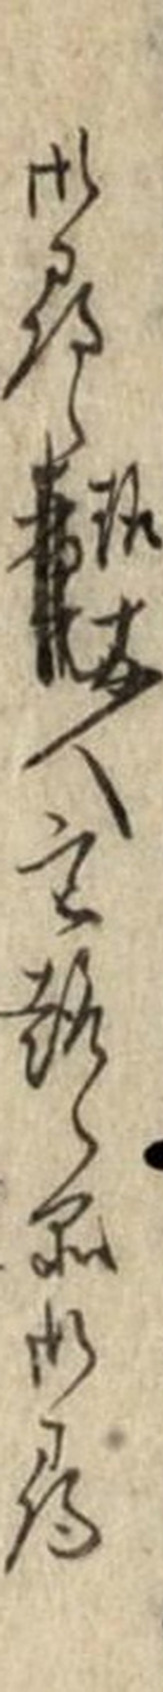御尋之趣両人意趣之品御尋
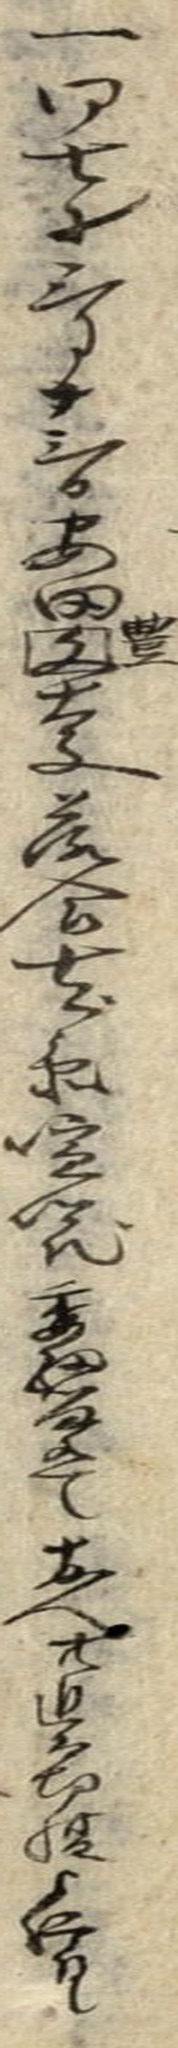一同七刁三月十三日安田文豊大夫落合七郎兵衛喧嘩委細留有之両人共追而切腹被仰付候
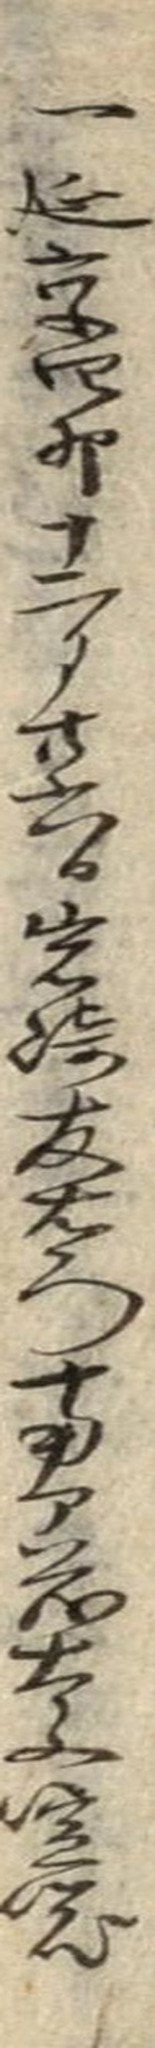一延享四卯十二月廿六日岩崎友右衛門南部茂大夫喧嘩
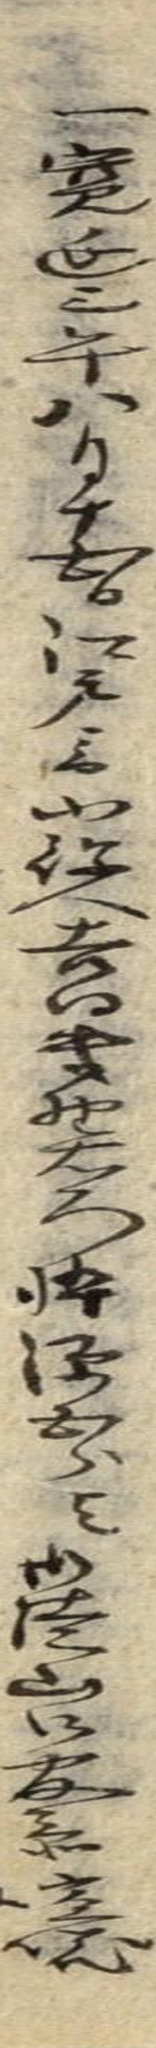一寛延三午八月十五日江戸ニ而小役人吉田幾野右衛門忰源五郎と御徒山口官兵衛喧嘩
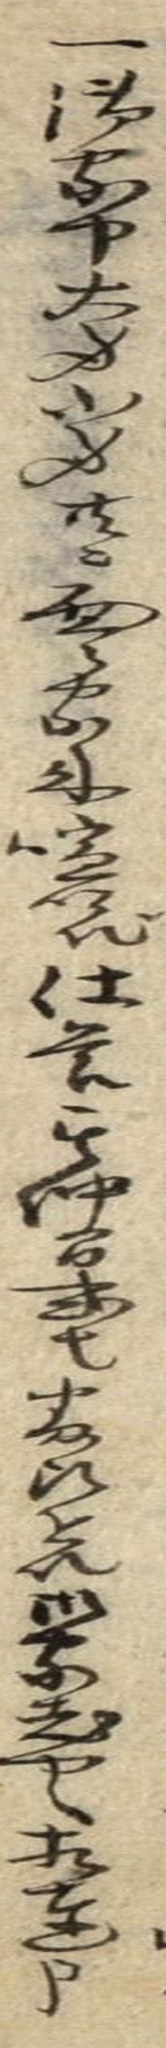一御家中大身小身共ニ面々家来喧嘩仕節其仲間或者番頭を以御家老へ相達申
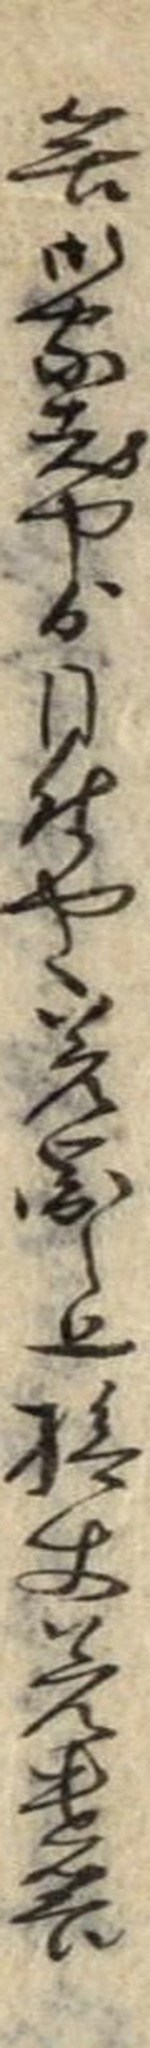筈御家老中ゟ目付中へ差図之上検使差遣筈
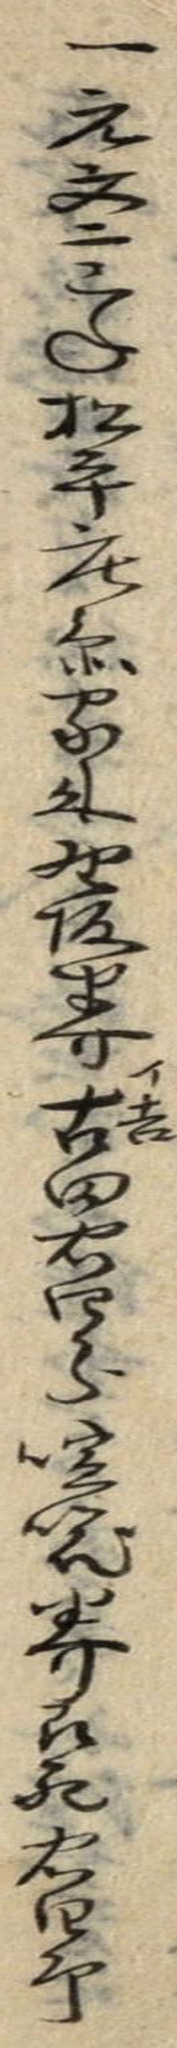一元文二巳年松平庄兵衛家来野坂半介古田忠四郎喧嘩半介即死忠四郎

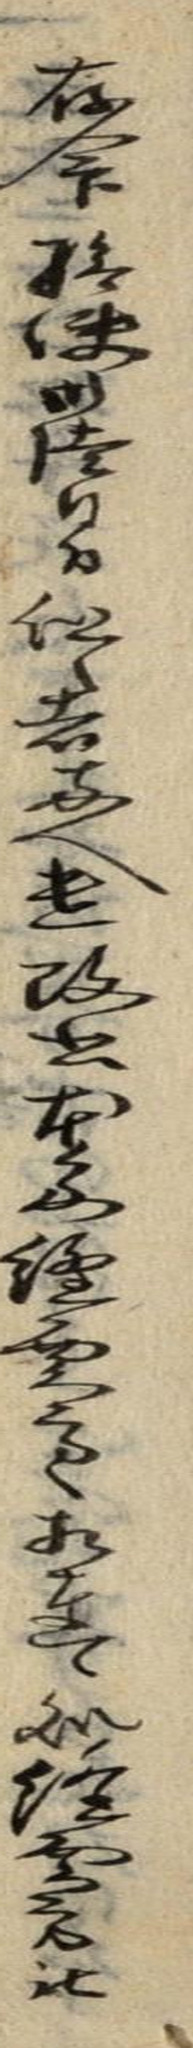存命検使御徒目付組之者両人遣改書本多縫殿方へ相達候処縫殿方被
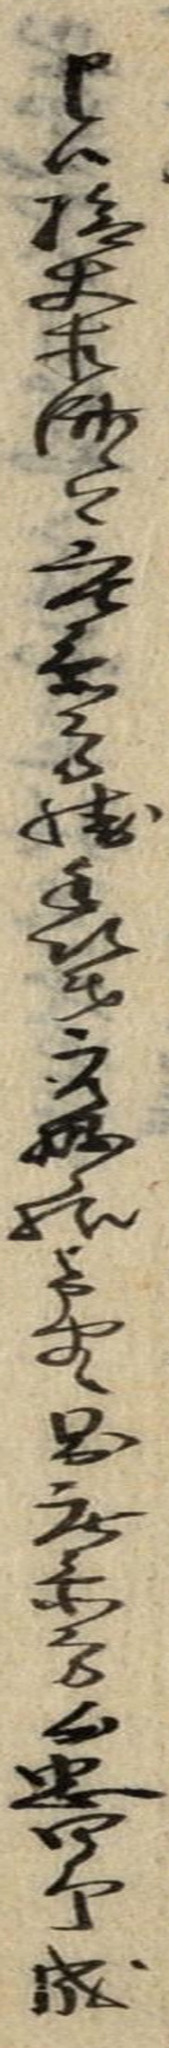申候は検使相済候はゝ庄兵衛方勝手次第取扱候様被申聞候則庄兵衛方ゟ忠四郎成
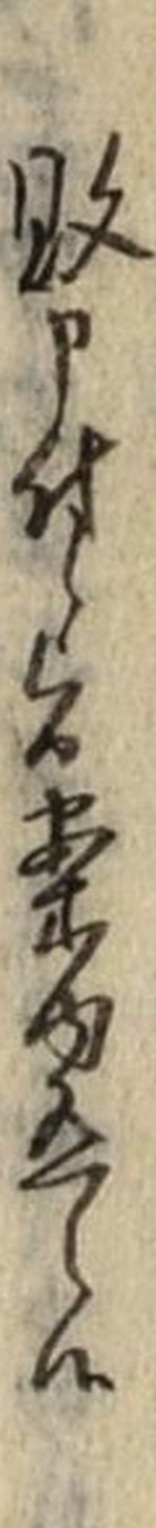敗申付候旨案内有之候
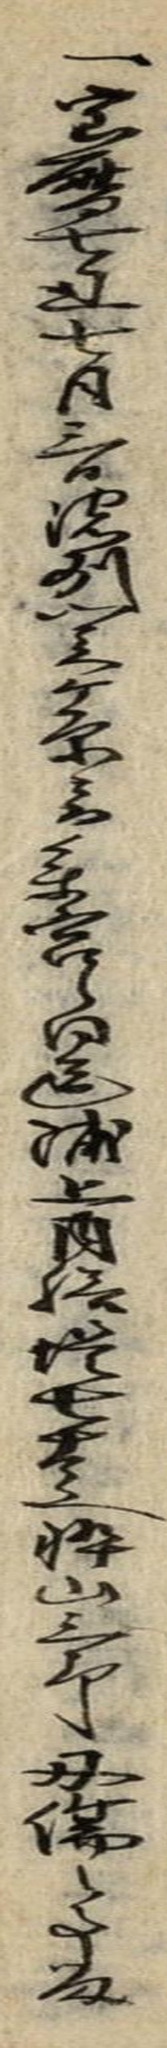一宝暦七丑七月三日濃州関ケ原にて参宮之同道浦上内膳堤七大夫悴山三郎刃傷之事留
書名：御停止異変死失
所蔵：福井県文書館 Fukui Prefectural Archives
